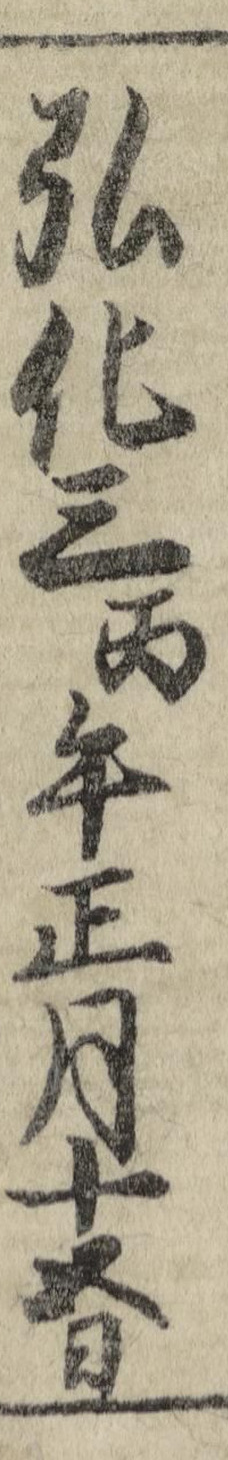弘化三丙午正月十五日
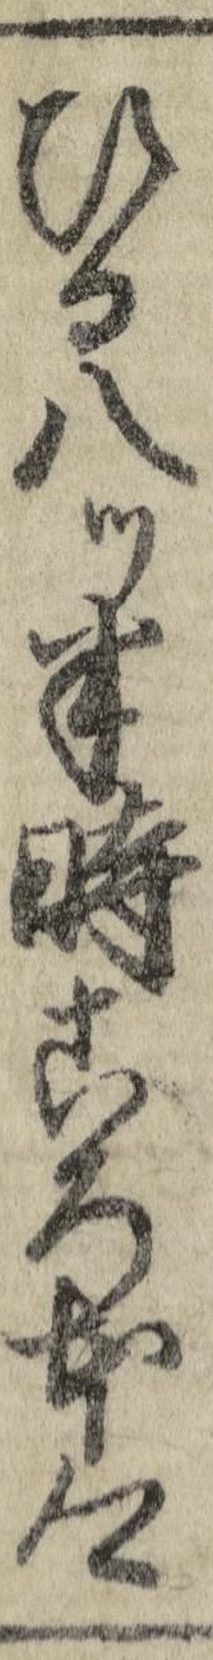ひる八ツ半時ころ本郷
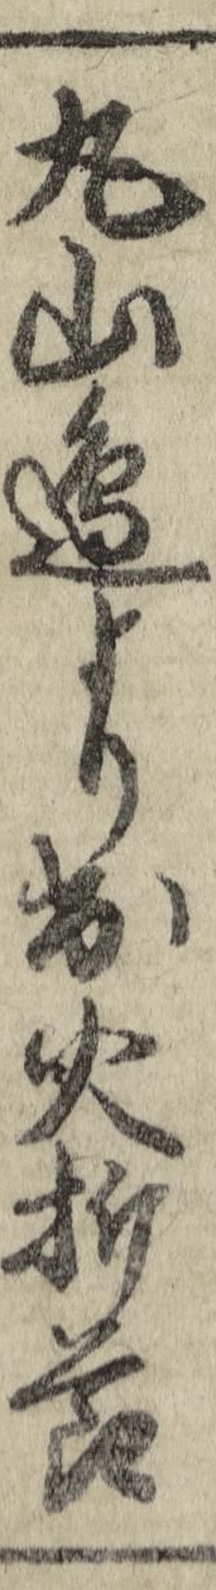丸山辺より出火折節
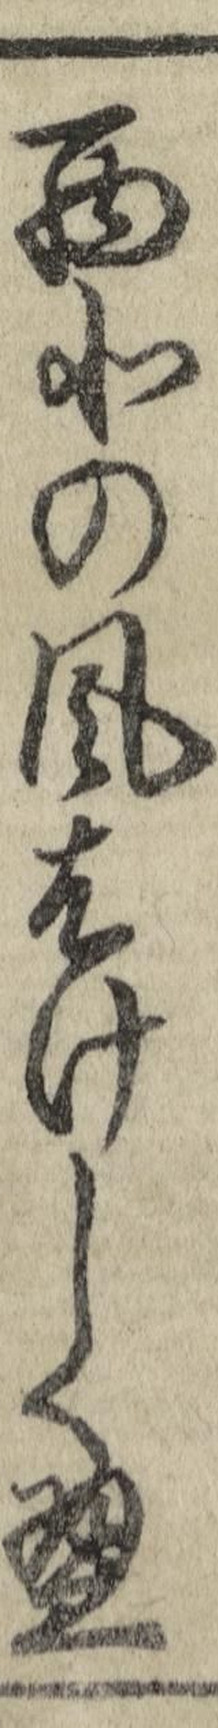西北の風はけしく翌
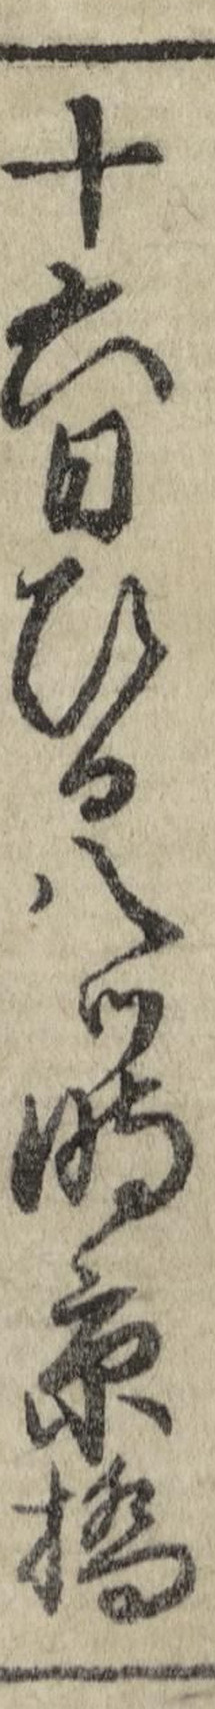十六日ひる八ツ時京橋
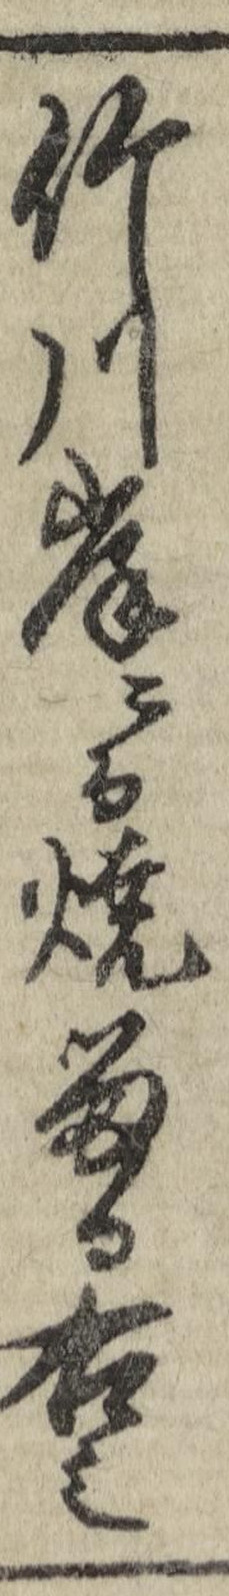竹川岸に而焼留る右の
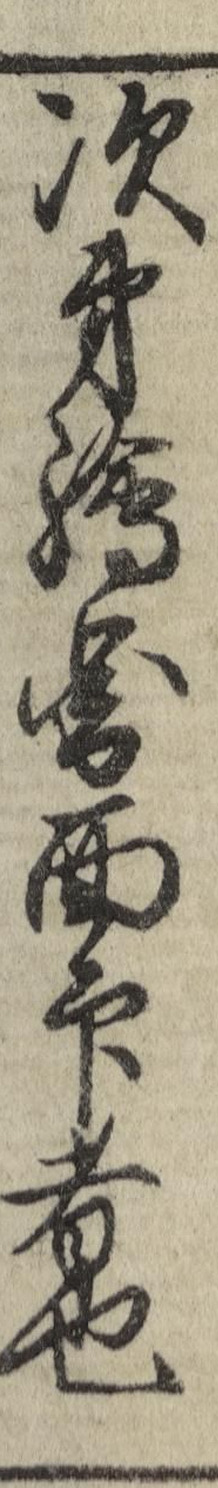次第絵図面印者也
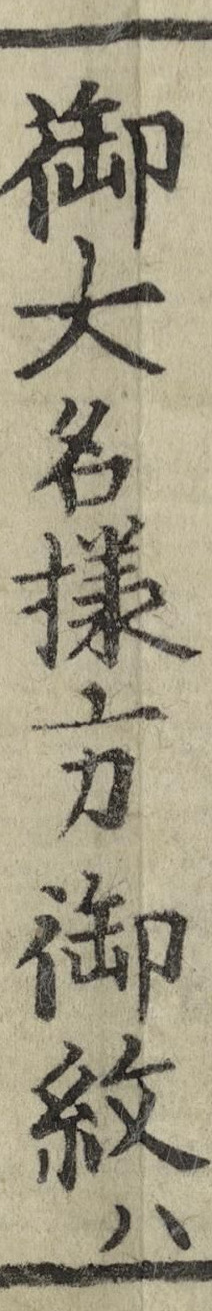御大名様方御紋は
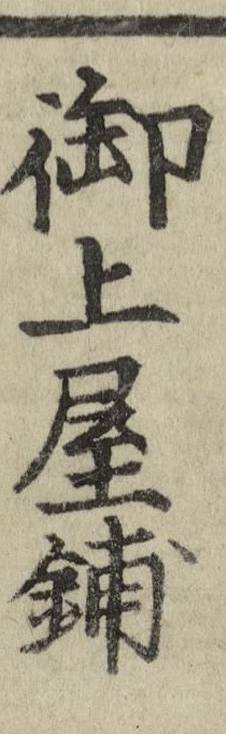御上屋鋪
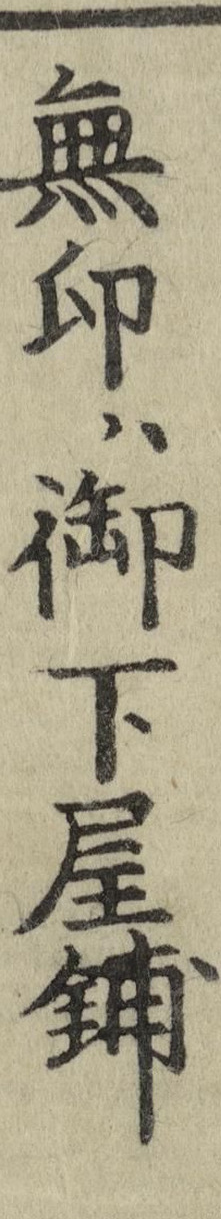無印は御下屋鋪
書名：[弘化三年一月の江戸大火に関する瓦版]
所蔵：東京大学地震研究所図書室 Earthquake Research Institute Library, The University of Tokyo, JAPAN
